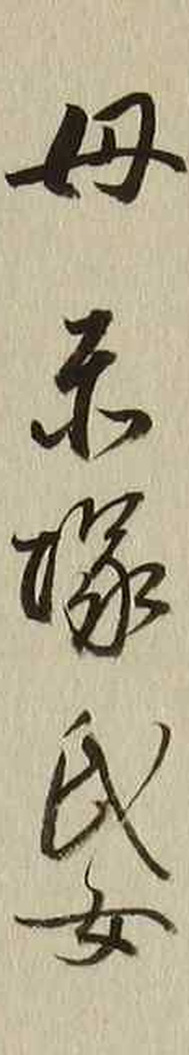母赤塚氏女
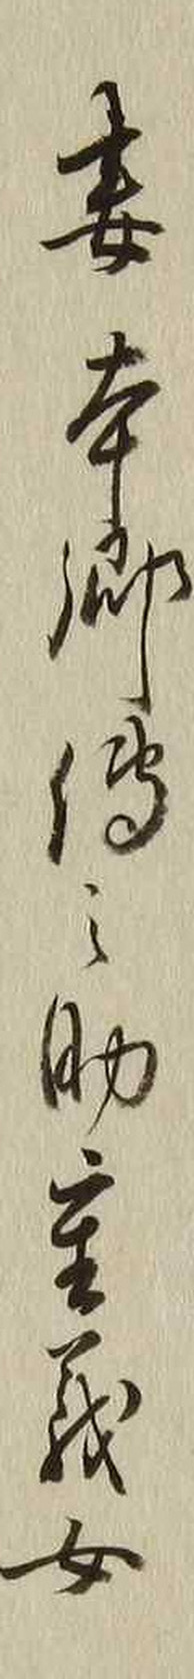妻本郷伝之助重義女
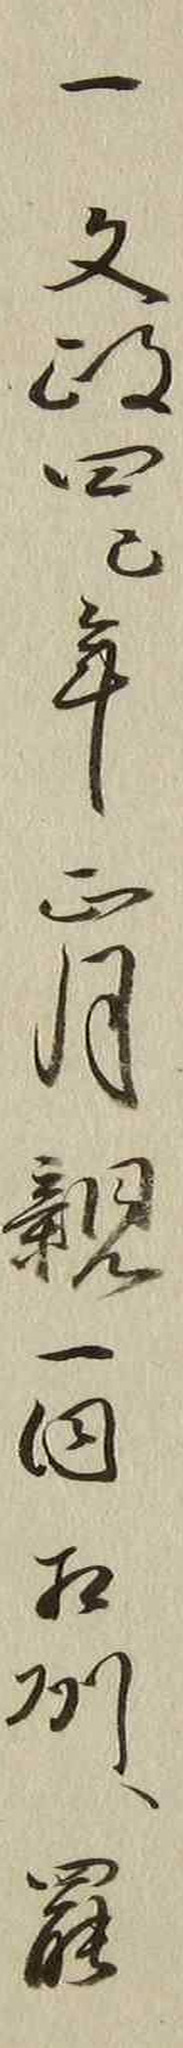一文政四巳年正月親一同相州へ罷
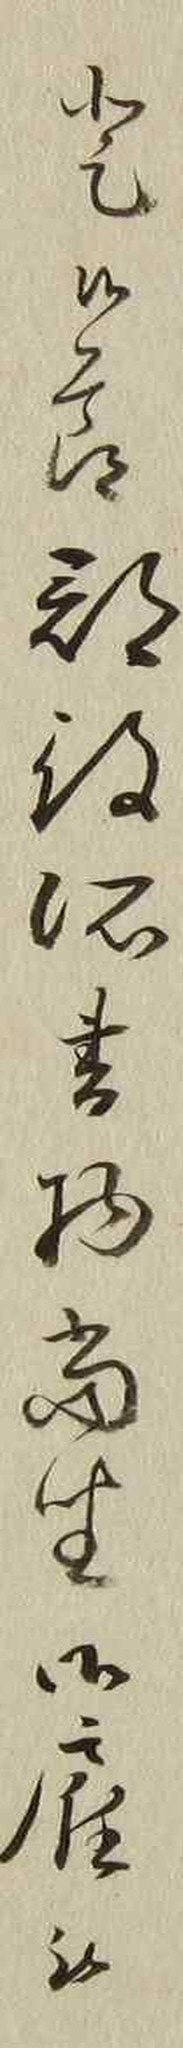登候節郡役所書物当坐御雇被
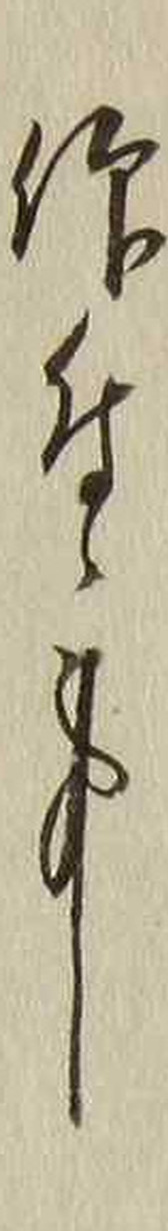仰付候事
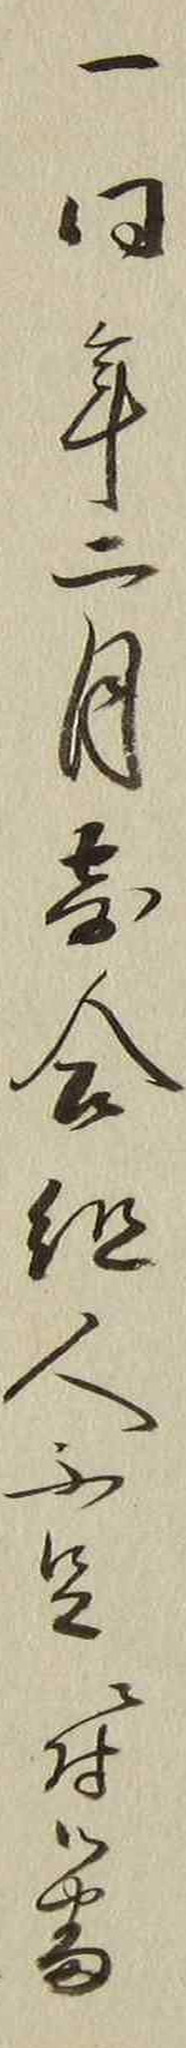一同年二月寄合組人不足ニ付御番
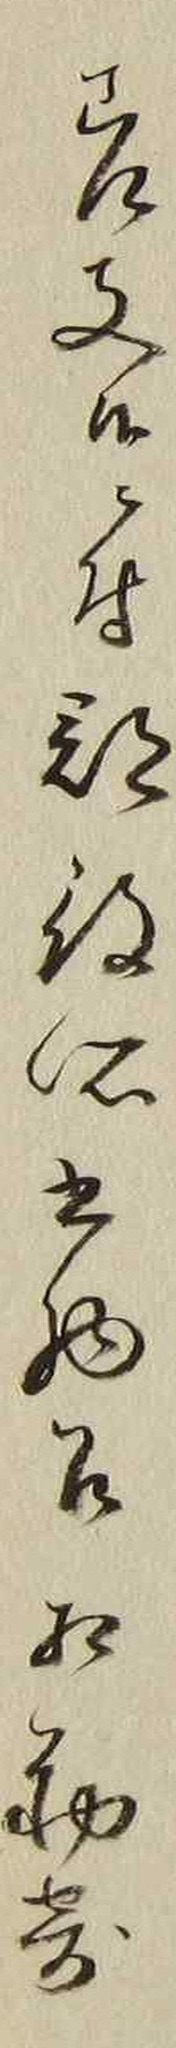差支候ニ付郡役所書物乍相勤寄
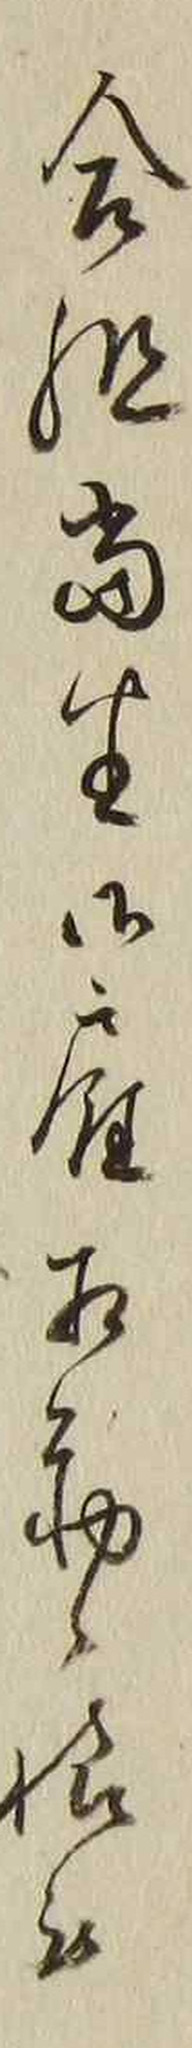合組当坐御雇相勤候様被
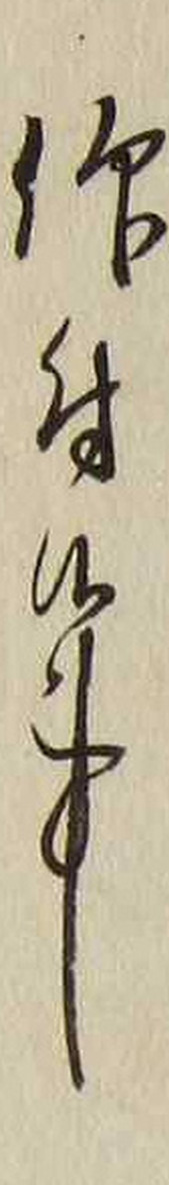仰付候事

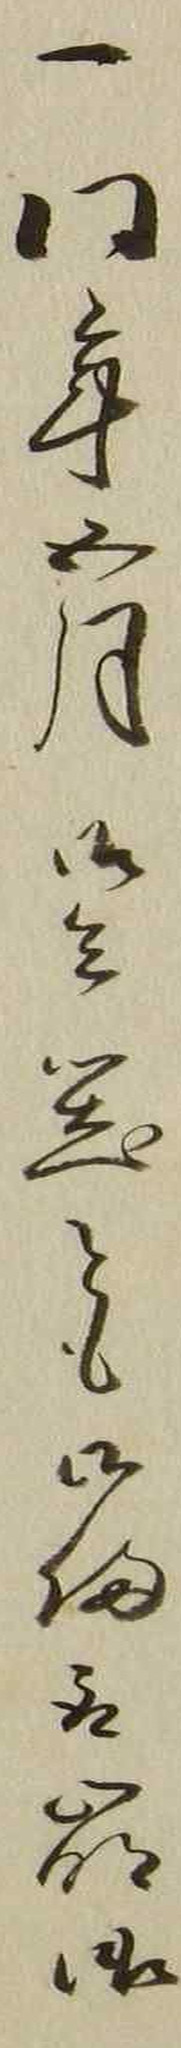一同年五月御兵器とも御帰取崩御
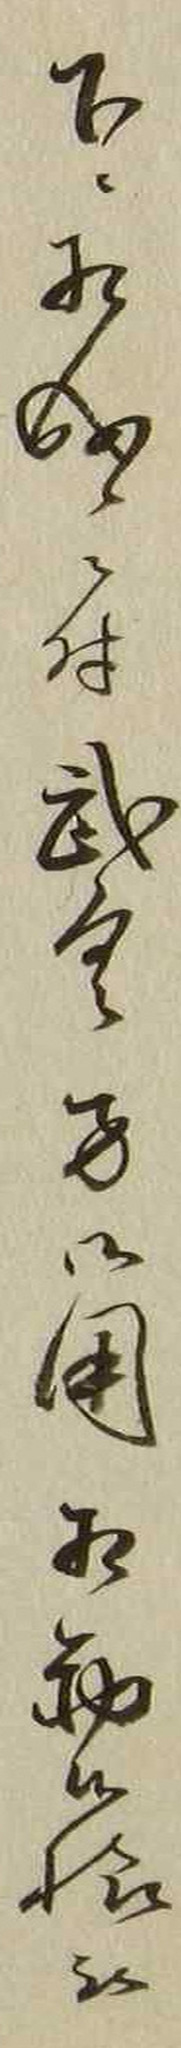下ニ相成候ニ付武具方御用相勤候様被
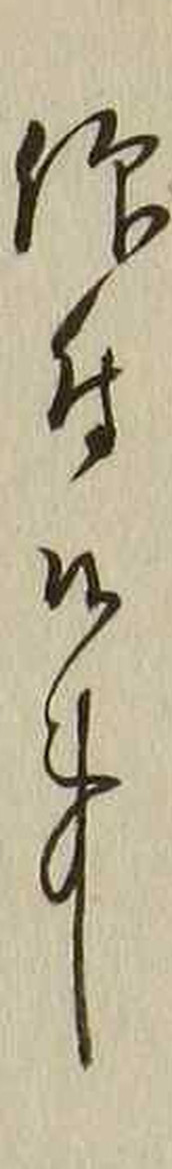仰付候事
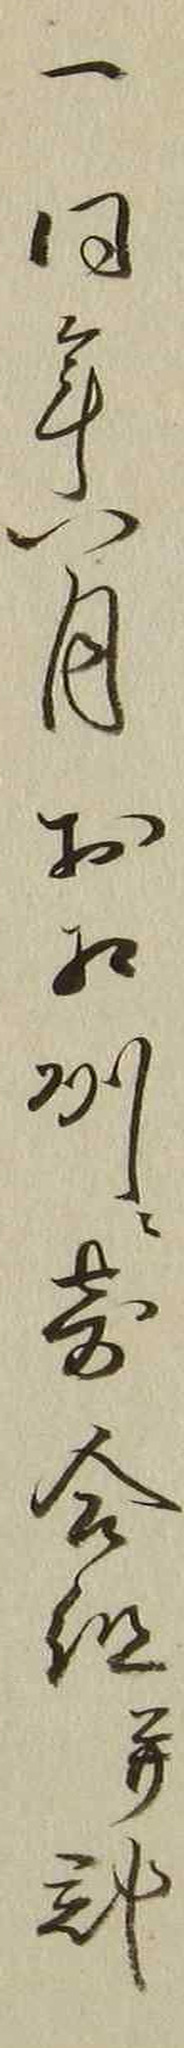一同年八月於相州ニ寄合組幷郡
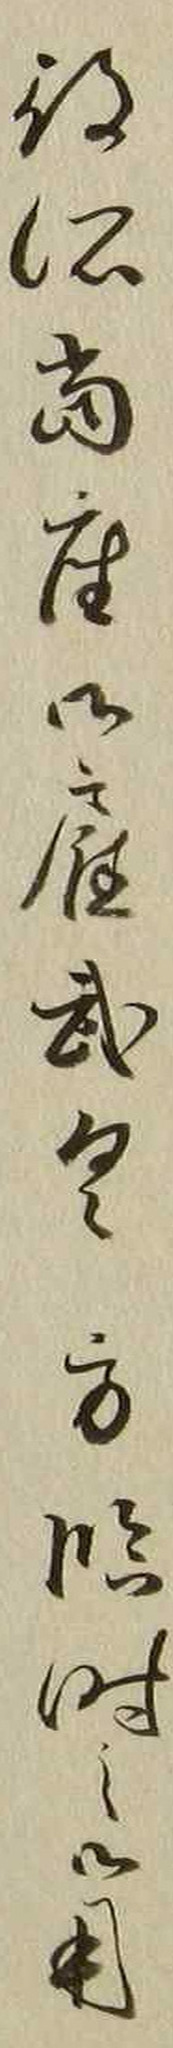役所当座御雇武具方臨時之御用
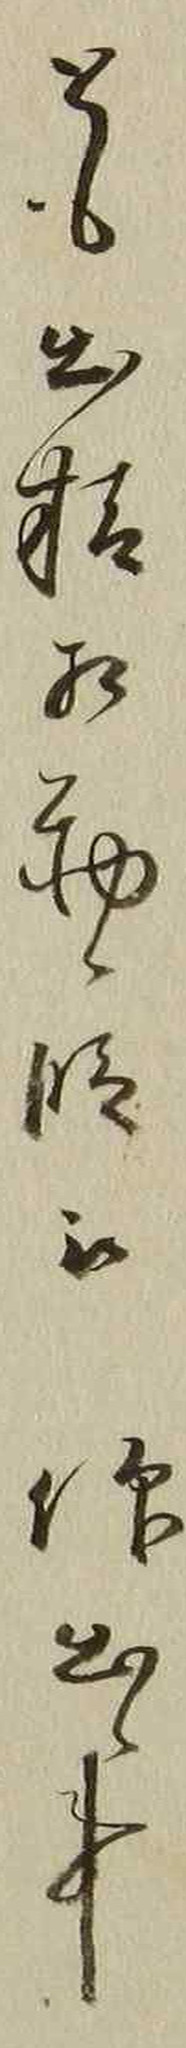とも出精相勤候段被仰出候事
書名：諸士系譜　巻之52　に之部3
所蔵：会津若松市立会津図書館
